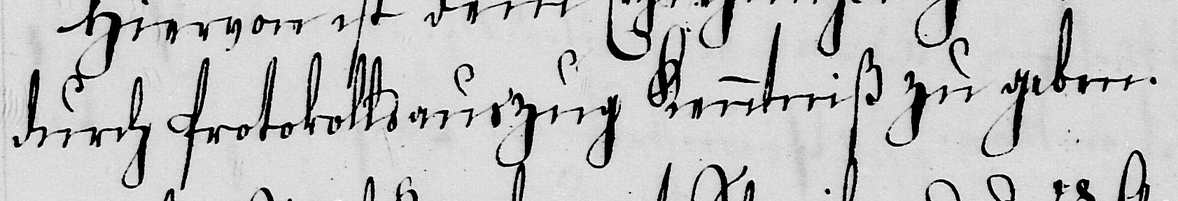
durch Protokollsauszug Kenntniß zu geben.
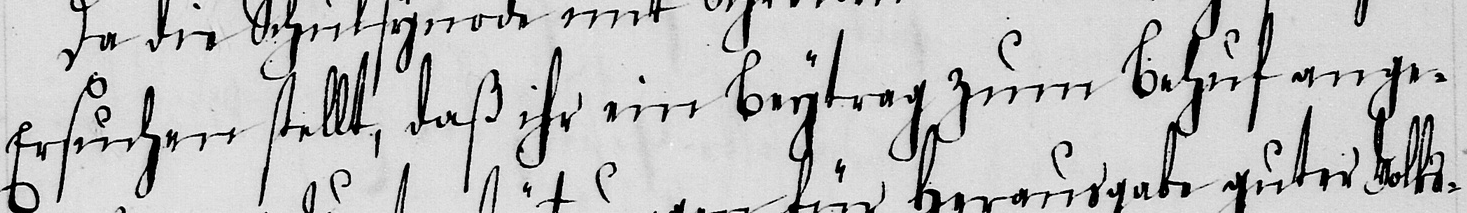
Ersuchen stellt, daß ein Beytrag zum Behuf ange¬
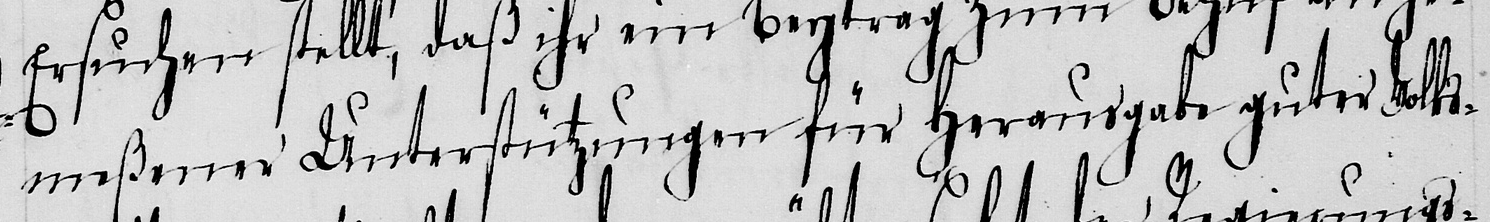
meßener Unterstützungen für Herausgabe guter Volks¬
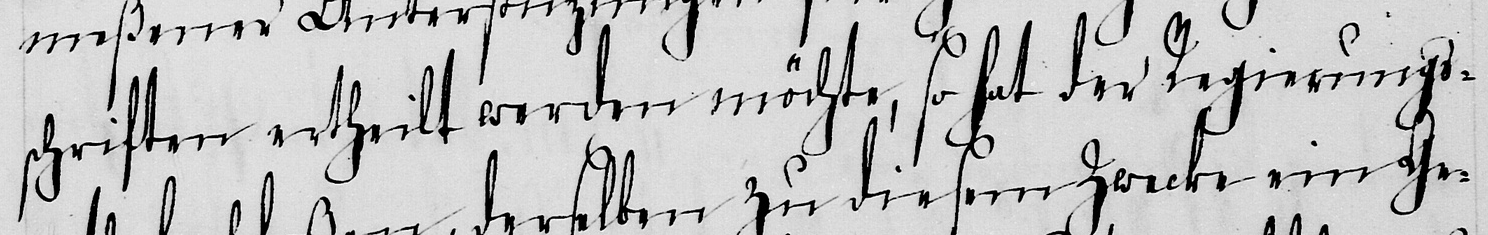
schriften ertheilt werden möchte, so hat der Regierungs¬
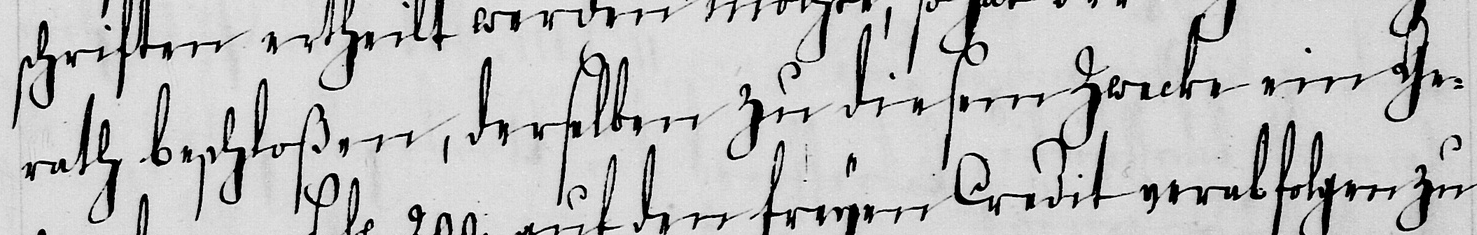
rath beschloßen, derselben zu diesem Zwecke ein Ges¬
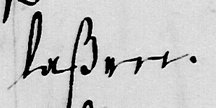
laßen.
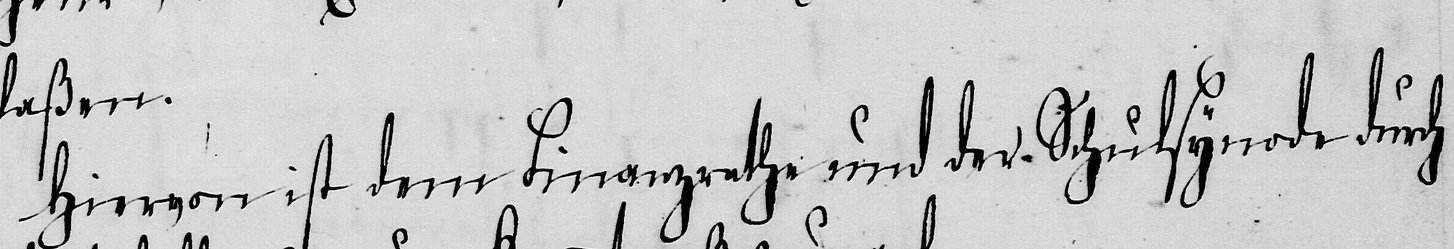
Hiervon ist dem Finanzrath und der Schulsynode durch
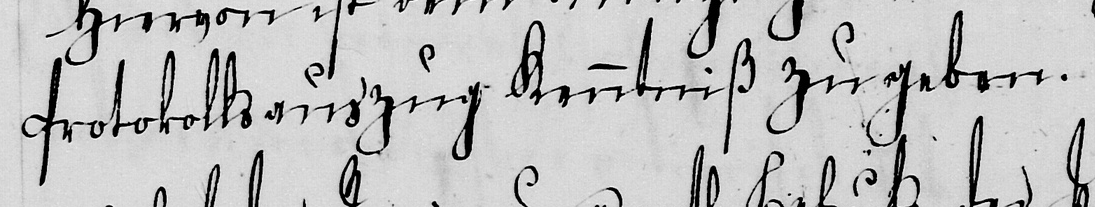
Protokollsauszug Kenntniß zu geben.
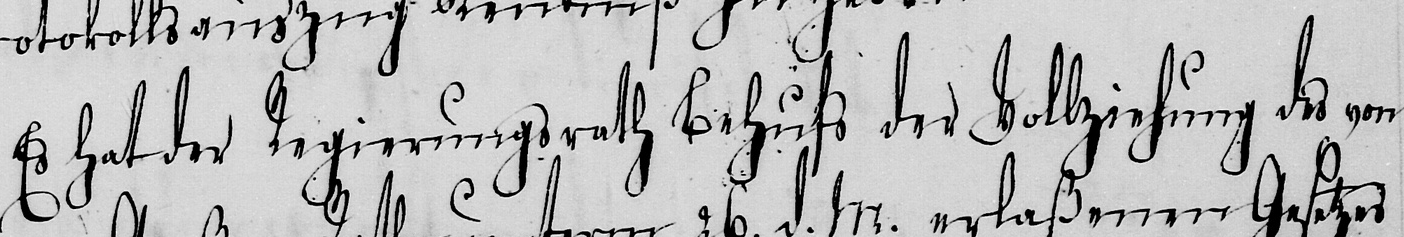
Es hat der Regierungsrath Behufs der Vollziehung des
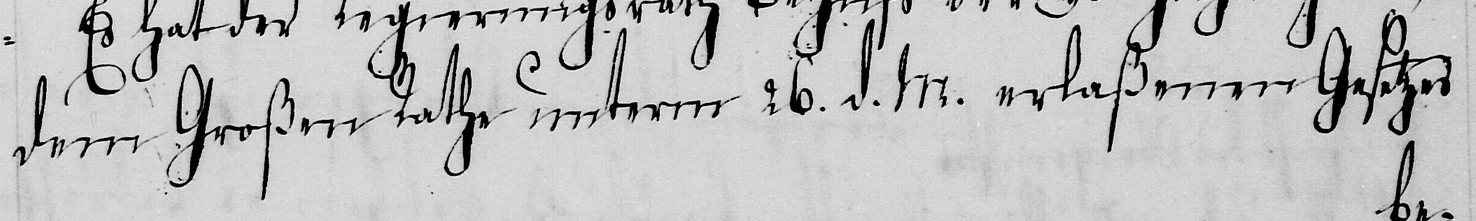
dem Großen Rathe unterm 26. d. M. erlaßenen Gesetzes
